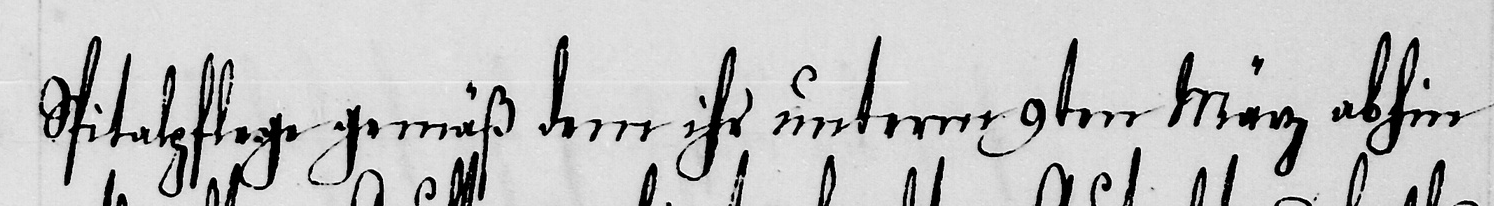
Spitalpflege gemäß dem ihr unterm 9ten Mäy abhin
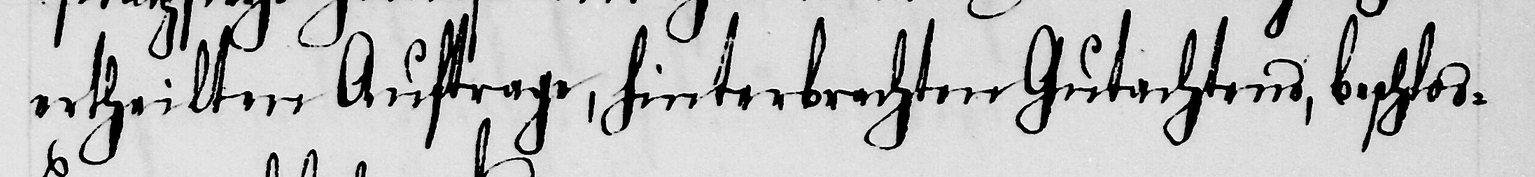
ertheilten Auftrage, hinterbrachten Gutachtens, beschlo¬
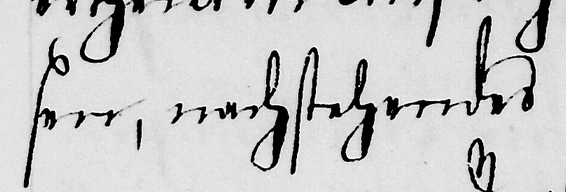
ßen, nachstehendes
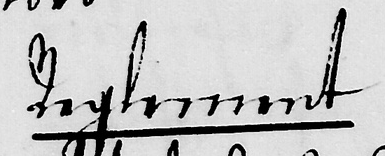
Reglement
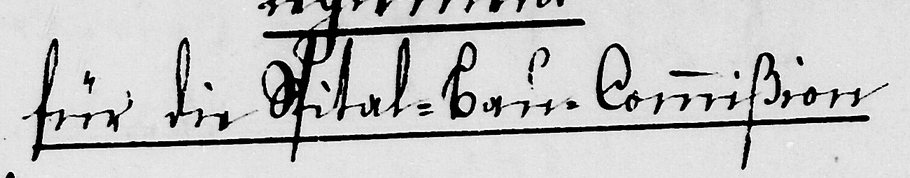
für die Spital-Bau-Commißion
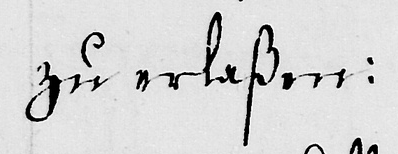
zu erlaßen:
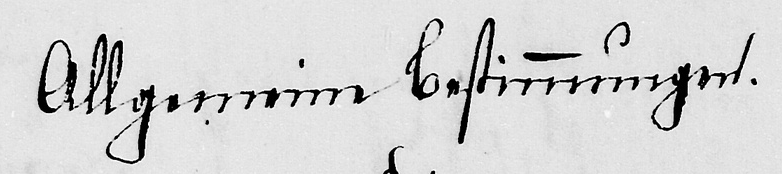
Allgemeine Bestimmungen.
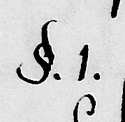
§.1.
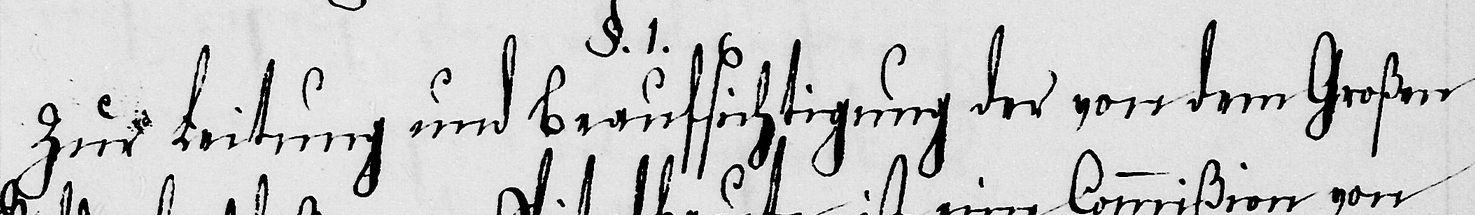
Zur Leitung und Beaufsichtigung der von dem Großen
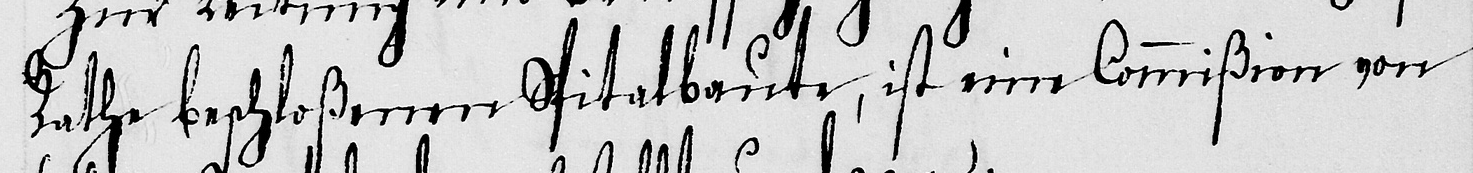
Rathe beschloßenen Spitalbaute, ist eine Commißion von
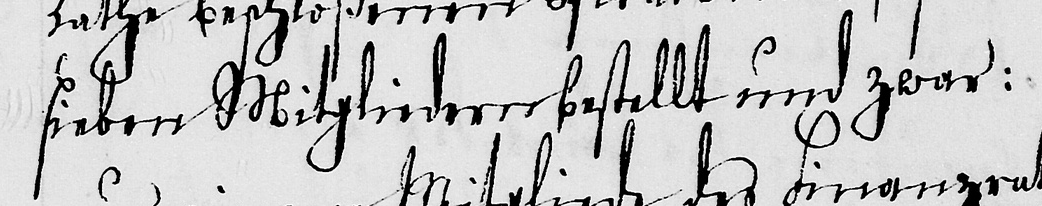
sieben Mitgliedern bestellt und zwar:
